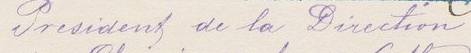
President de la Direction
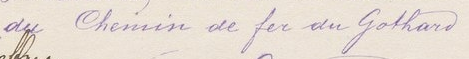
du Chemin de fer du Gothard
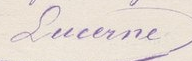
Lucerne
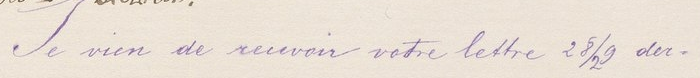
Je vien de recevoir votre lettre 28/29 der-
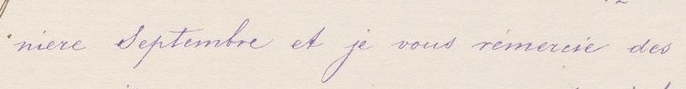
niere Septembre et je vous remercie des
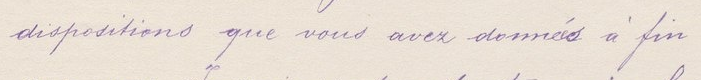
dispositions que vous avez données à fin
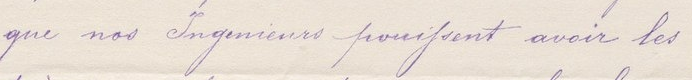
que nos Ingenieurs pouissent avoir les
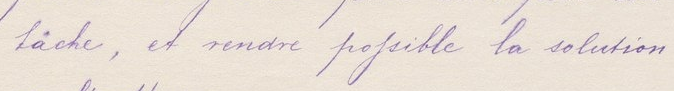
tâche, et rendre possible la solution
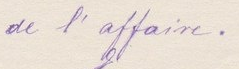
de l'affaire.
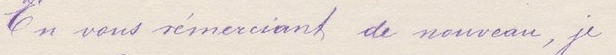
En vous rémerciant de nouveau, je
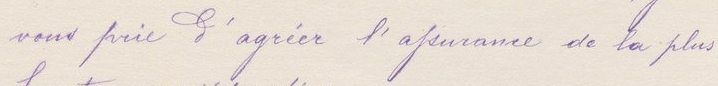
vous prie d'agréer l'assurance de la plus
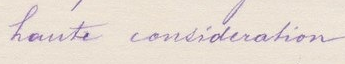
haute consideration
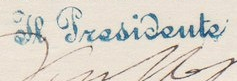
Il Presidente
